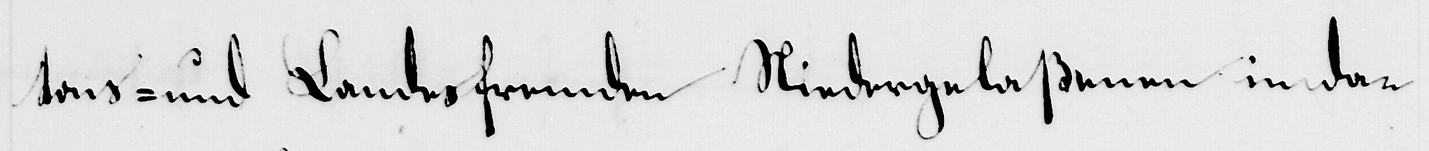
tons- und Landesfremden Niedergelaßenen in da¬
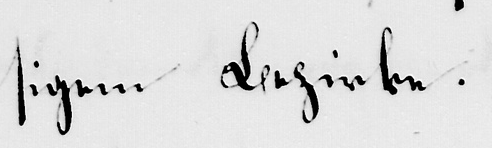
sigem Bezirke.
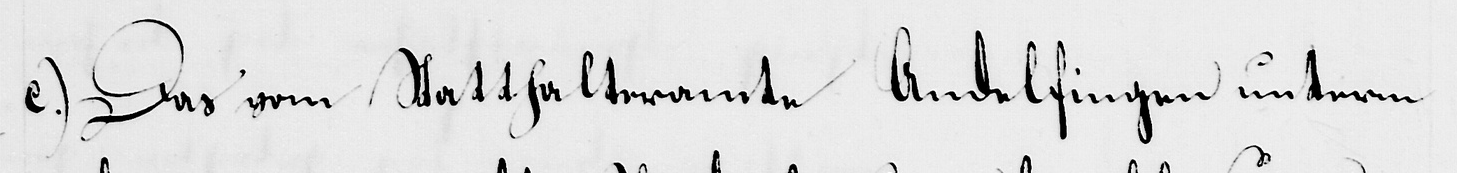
c.) Das vom Statthalteramte Andelfingen unterm
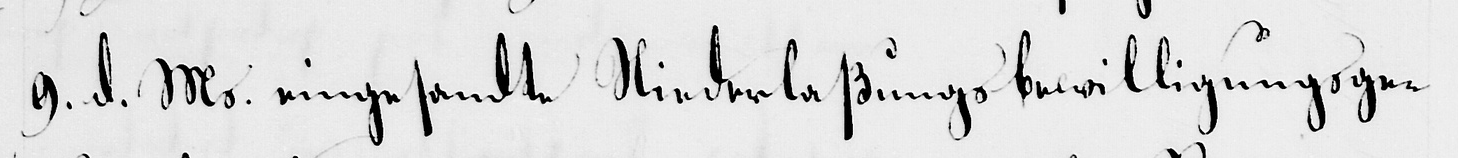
9. d. Ms. eingesandte Niederlaßungsbewilligungsge¬
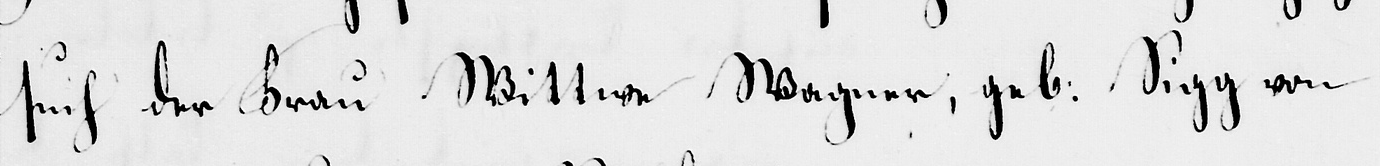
such der Frau Wittwe Wagner, geb: Sigg von
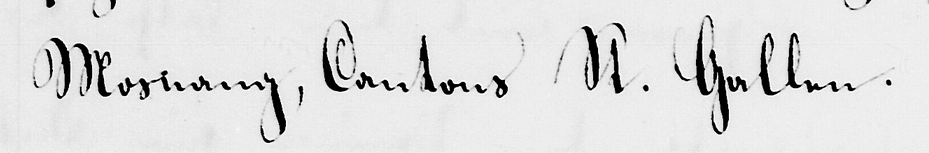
Mosnang, Cantons St. Gallen.
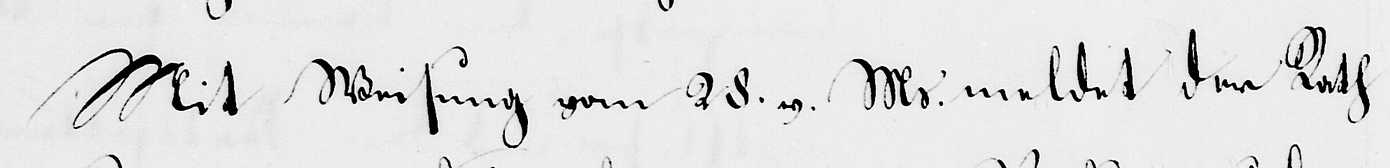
Mit Weisung vom 28. v. Ms. meldet der Rath
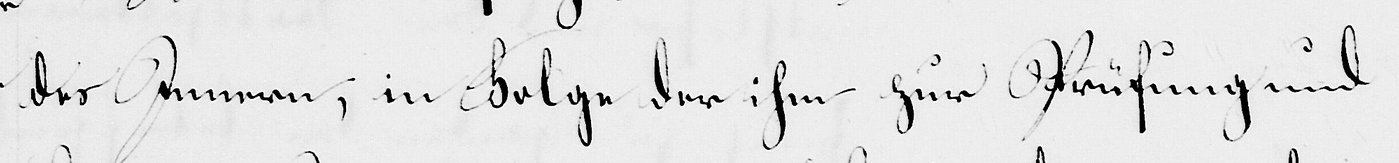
des Innern, in Folge der ihm zur Prüfung und
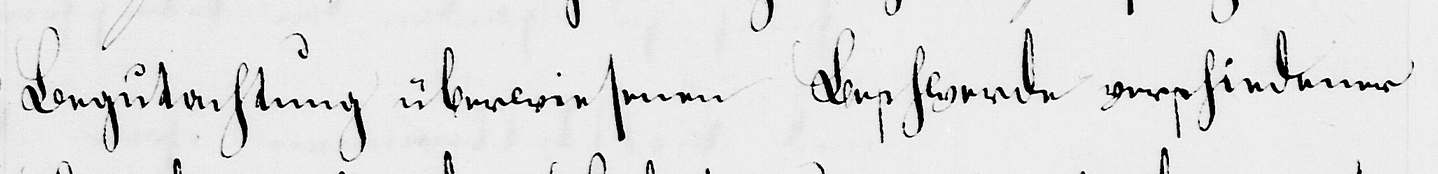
Begutachtung überwiesenen Beschwerde verschiedener
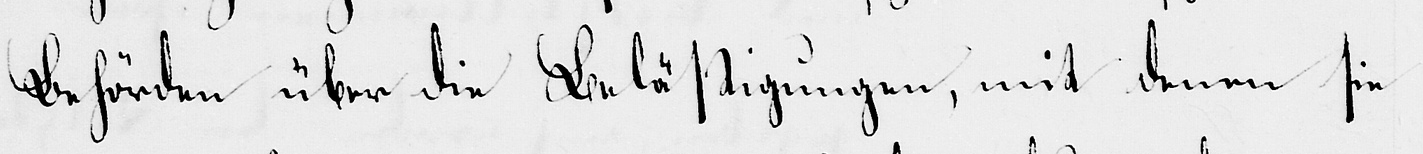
Behörden über die Belästigungen, mit denen sie
